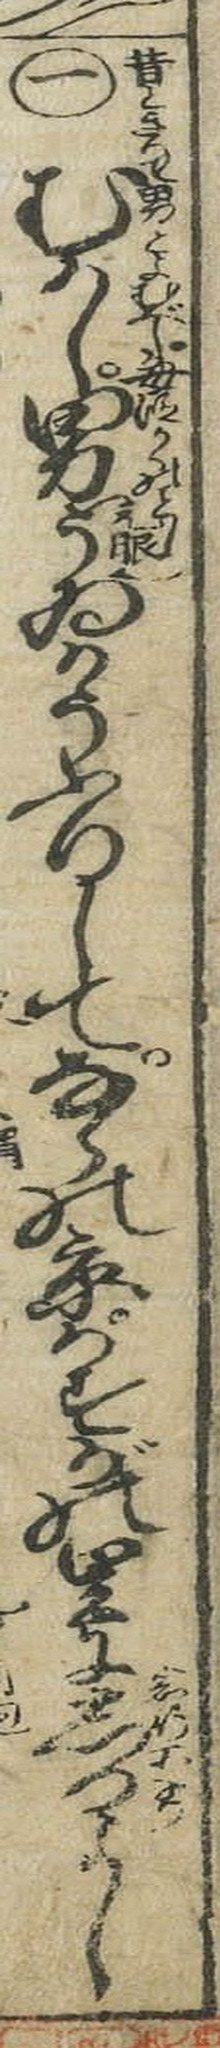㊀むかし。男うゐかうふりして。ならの京。かすがの里にしるよし
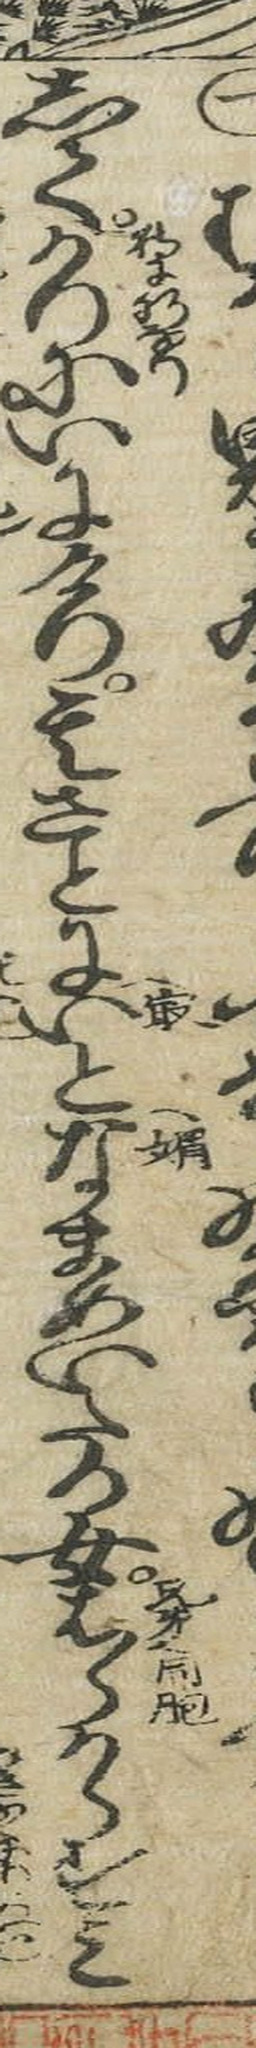して。かりにいにけり。其さとにいとなまめいたる女。はらからすみ
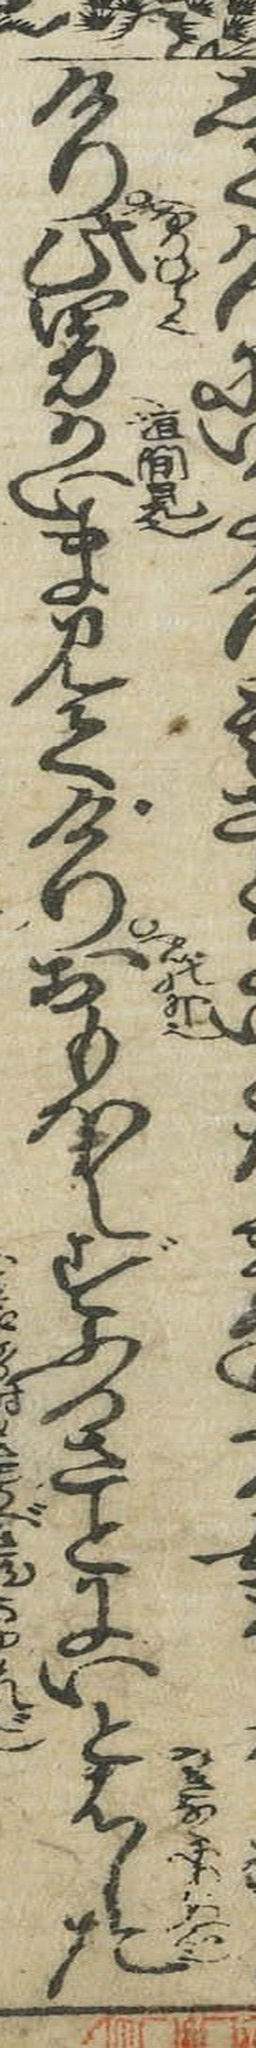けり。此男かいま見てけり。おもほえずふるさとにいとはした
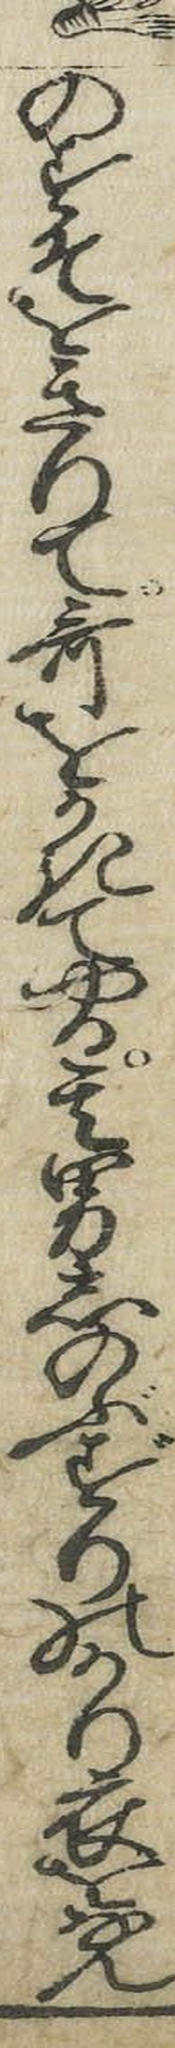のすそをきりて。哥をかきてやる。其男しのぶずりのかり衣をなん
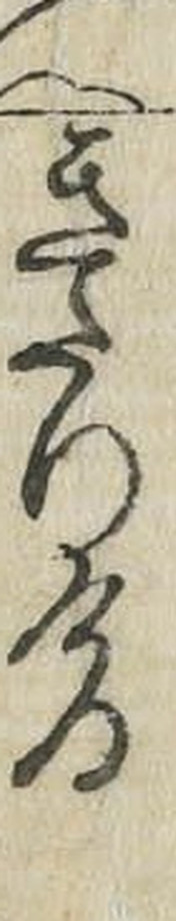きたりける
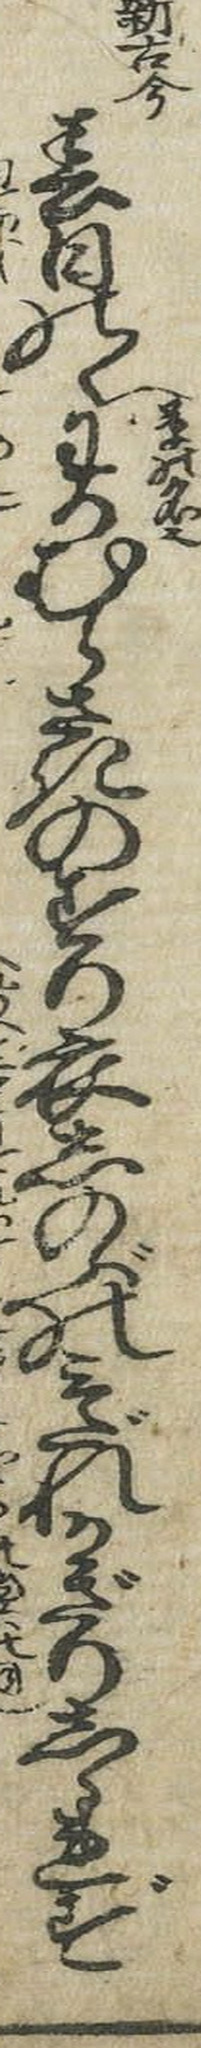春日のゝわかむらさきのすり衣しのぶのみだれかぎりしられず
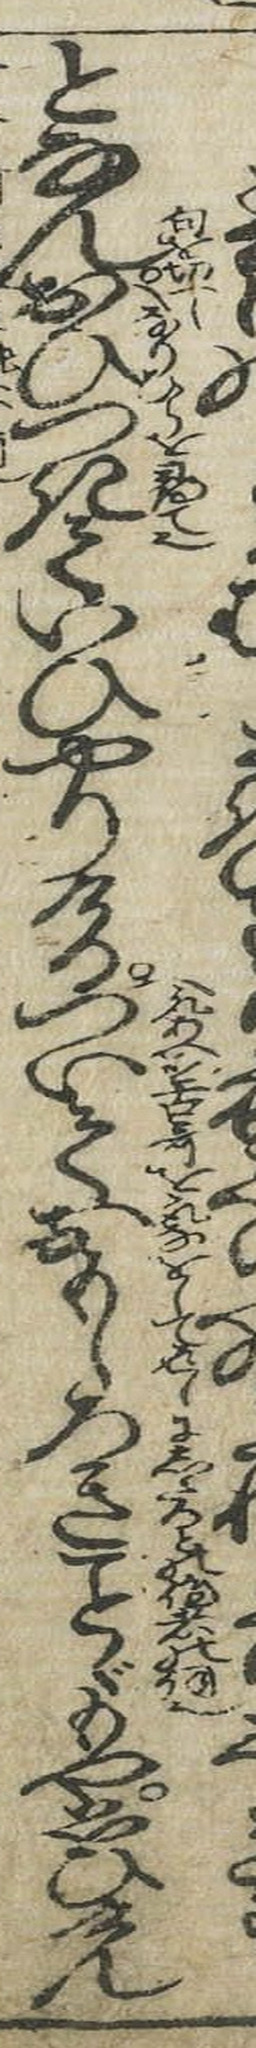となん。おひつきていひやりける。ついておもしろきことゞもや。思ひけん
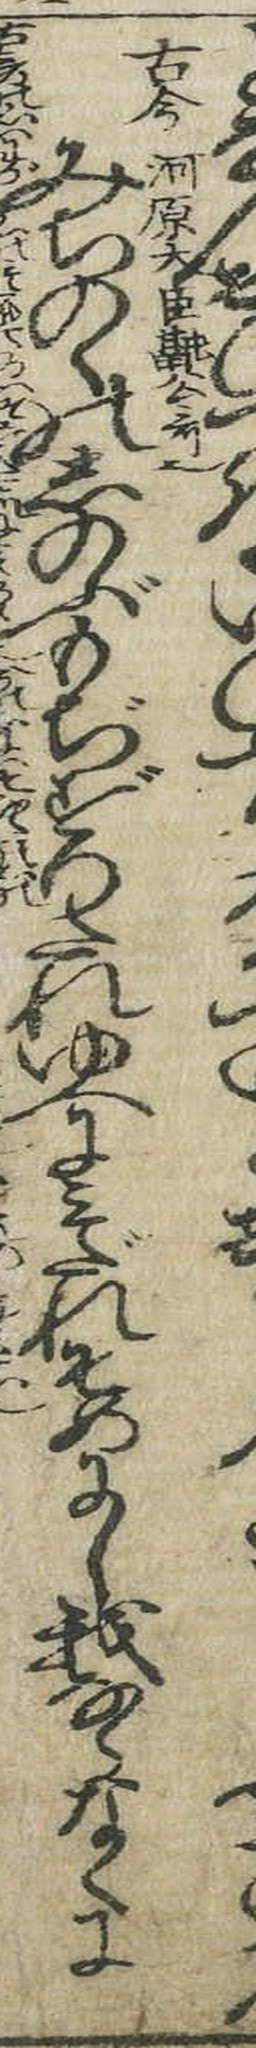みちのくのしのぶもぢずりたれゆへにみだれそめにし我ならなくに
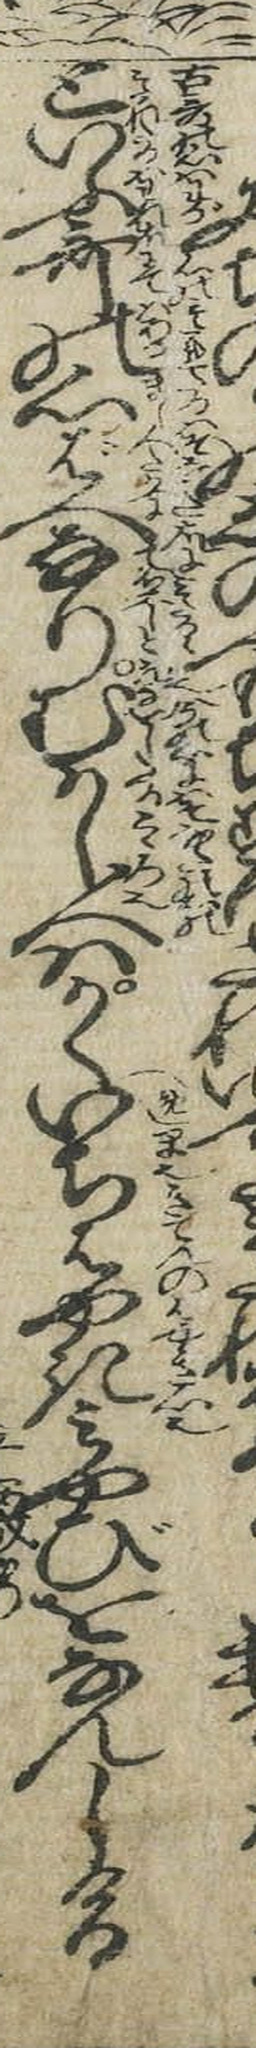といふ哥の心ばへなり。むかし人は。かくいちはやきみやびをなんしける
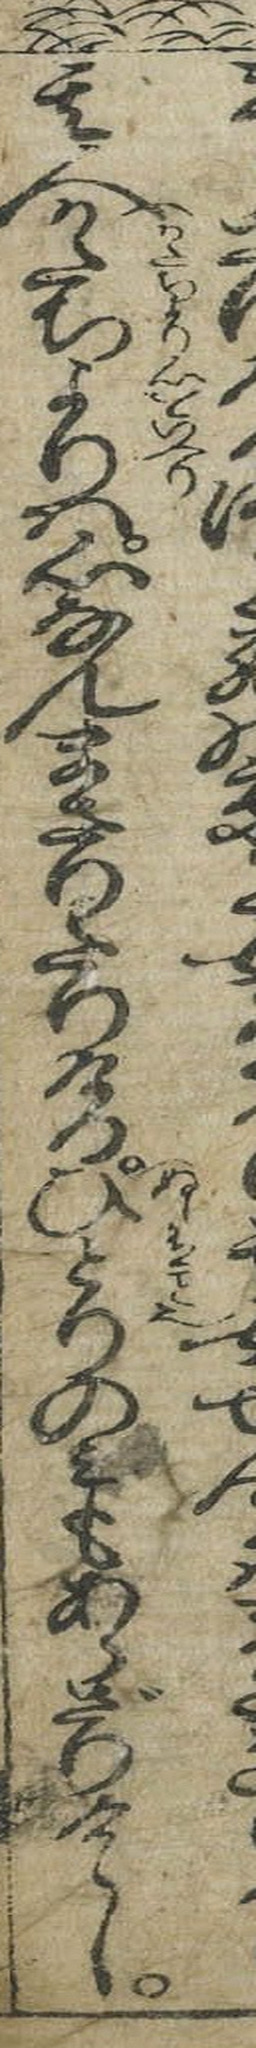其人かたちよりは。心なんまさりたりける。ひとりのみもあらざりけらし。

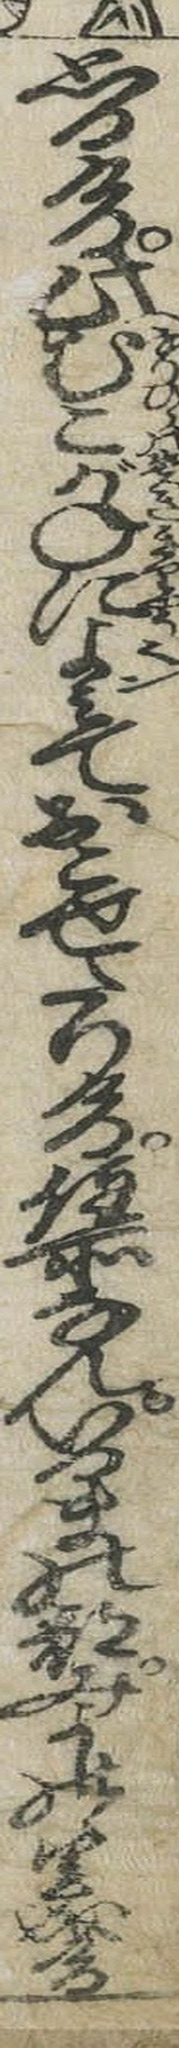思ひける。此むこがねによ。住所なん。いるまの郡。みよしのゝ里成ける
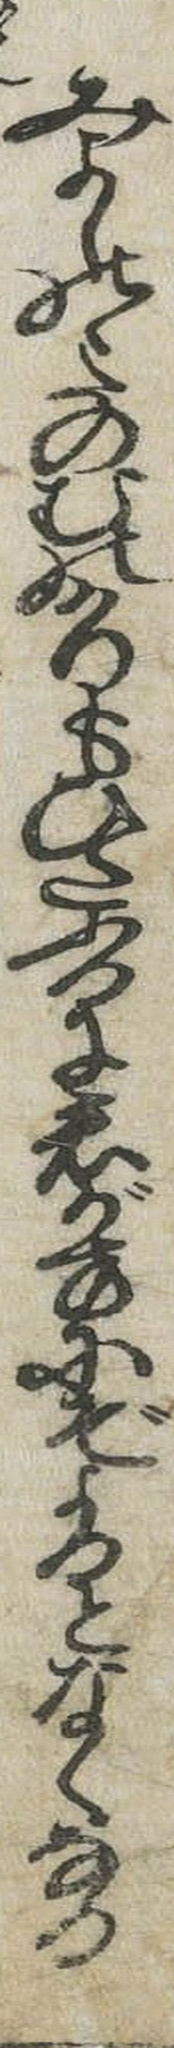みよしのゝたのむのかりもひたふるに君が方にぞよるとなくなる
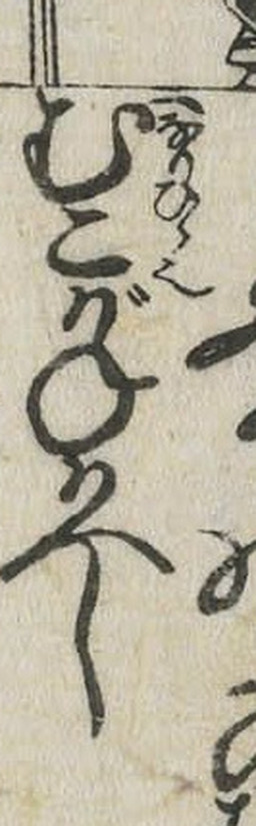むこがねかへし
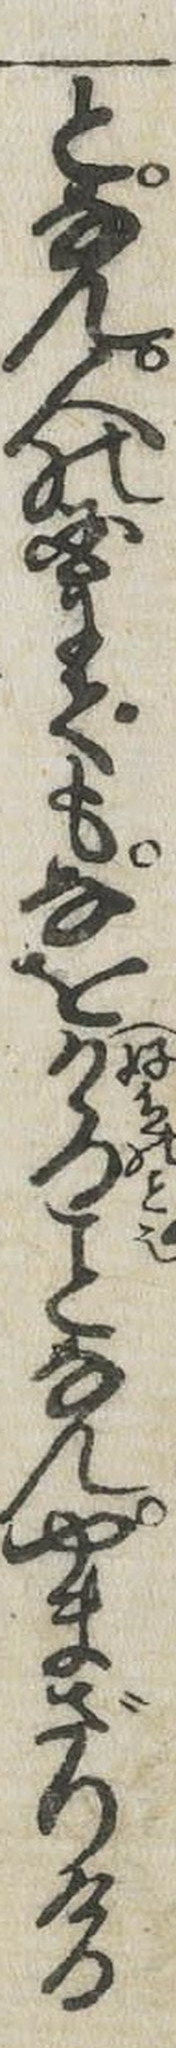と。なん。人の国にても。なをかゝることなん。やまざりける
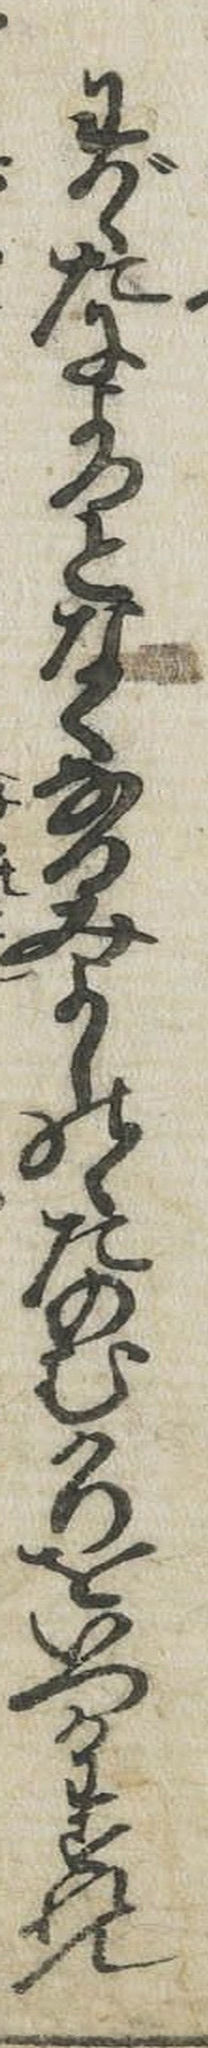わがゝたによるとなくなるみよしのゝたのむかりをいつかわすれん
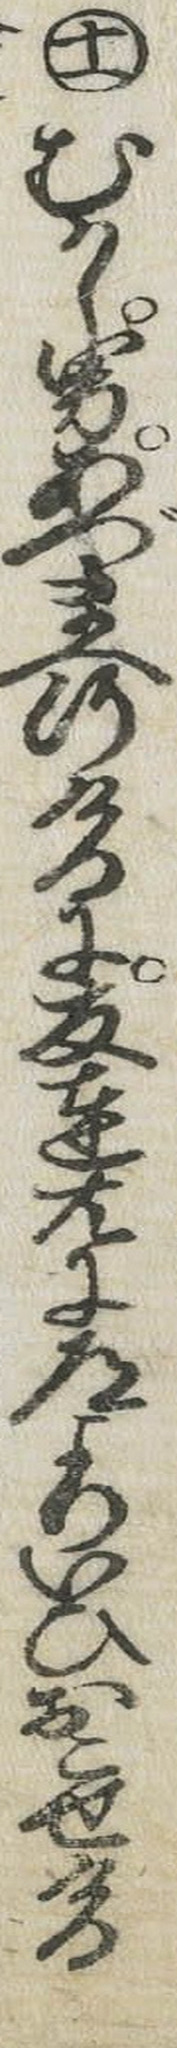(十一)むかし。男。あづまへ行けるに。友達共に道よりいひおこせける
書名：新板絵入伊勢物語 : かうしやく付 2巻 上
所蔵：東京学芸大学教育コンテンツアーカイブ
